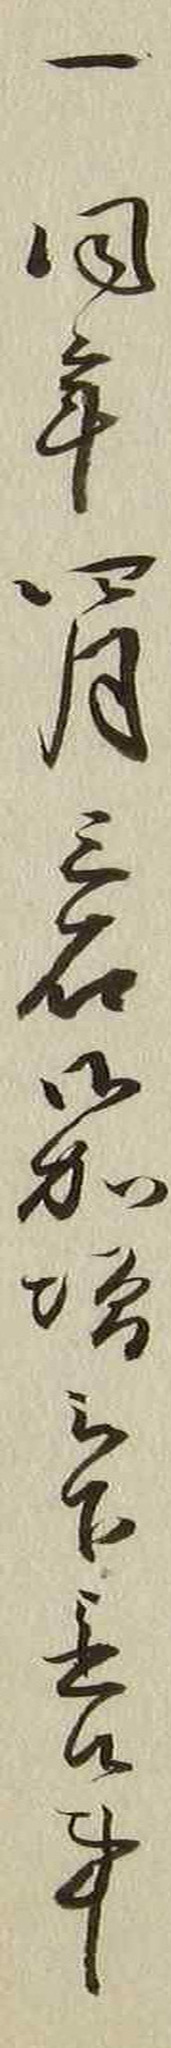一同年四月三石御加増被下置候事
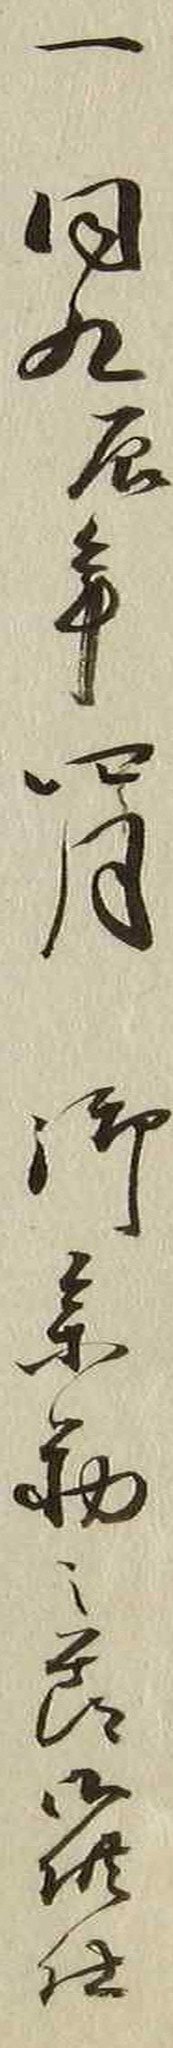一同九辰年四月御参勤之節御供仕
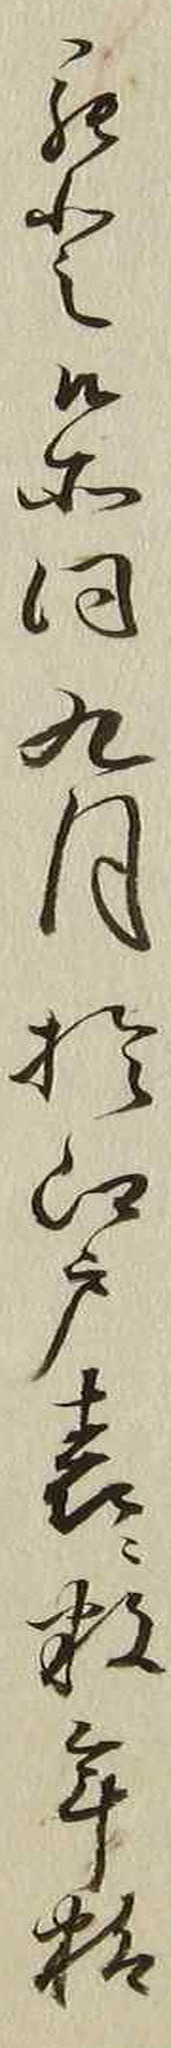罷登候所同九月於江戸表ニ数年精
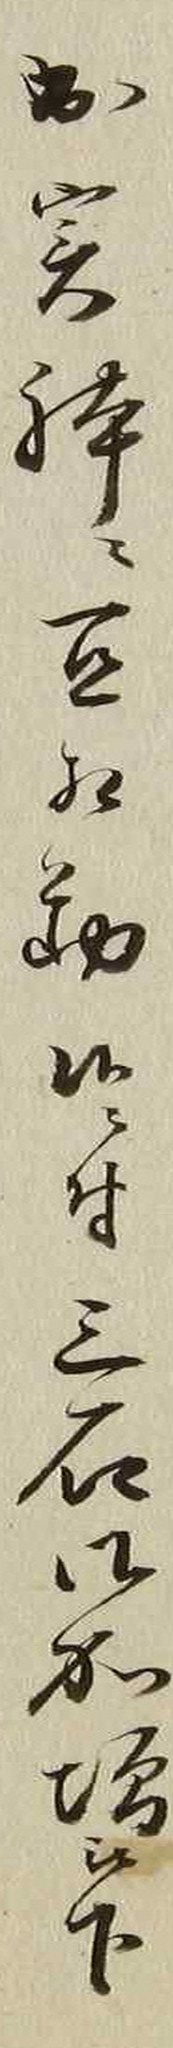出実体ニ宜相勤候ニ付三石御加増被下
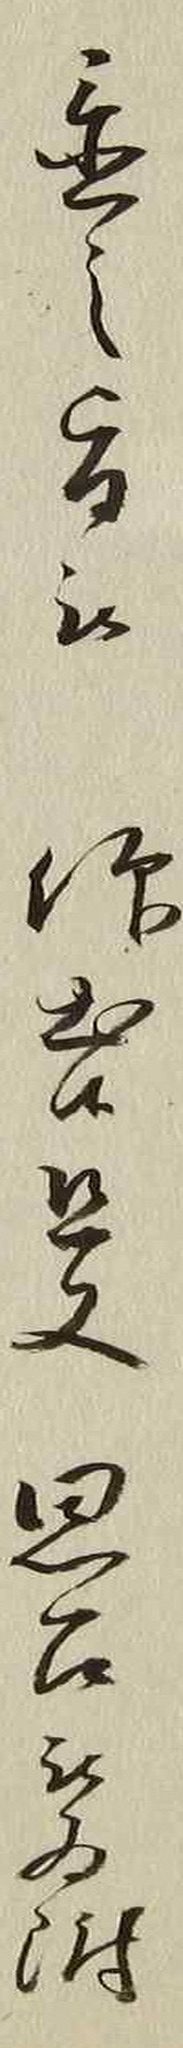置之旨被仰出候且又思召被為附
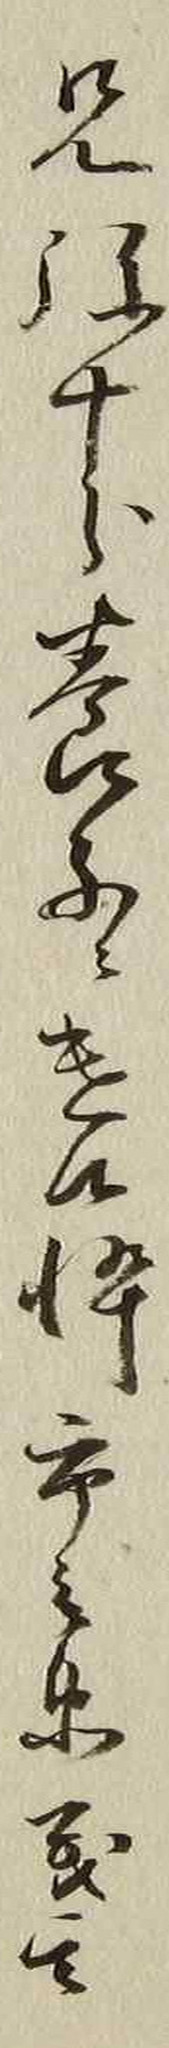兄弥十郎養子ニ遣候忰市兵衛義其
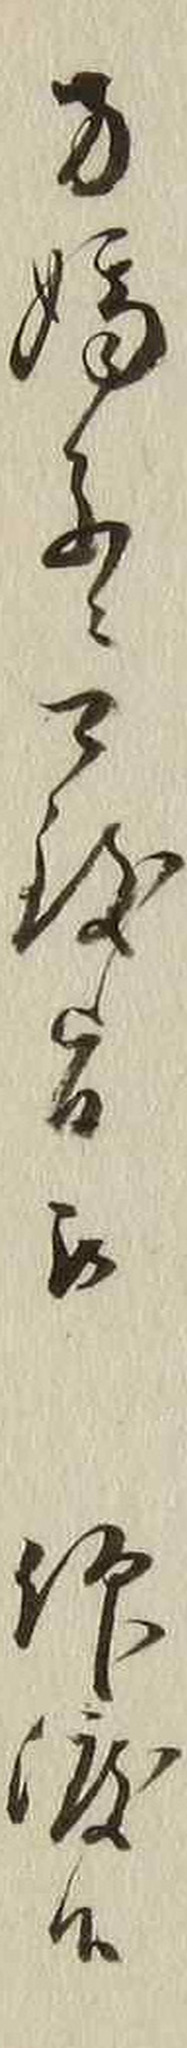方嫡子ニ可致旨被仰渡候
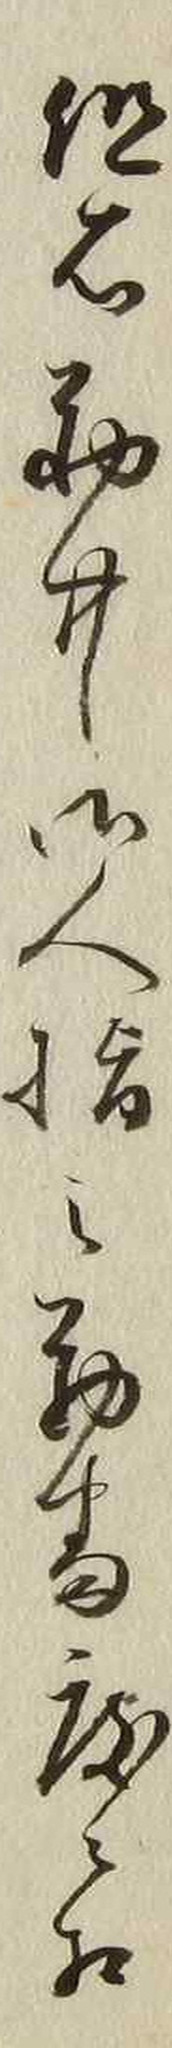但右勤中御人指之勤番度々相
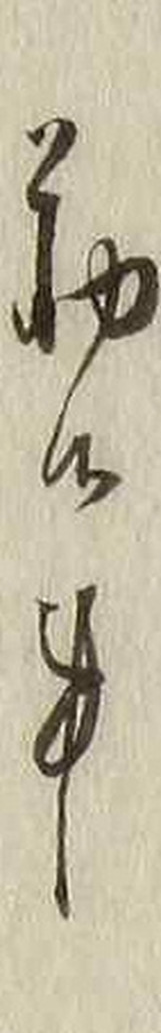勤候事
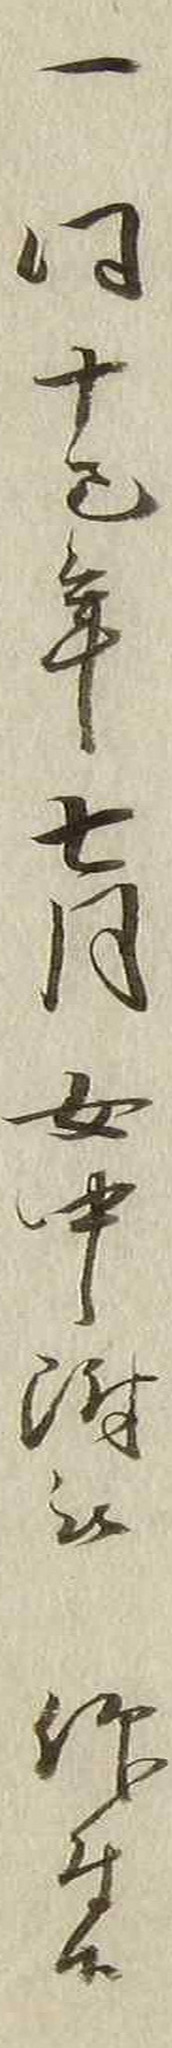一同十巳年七月女中附被仰付候
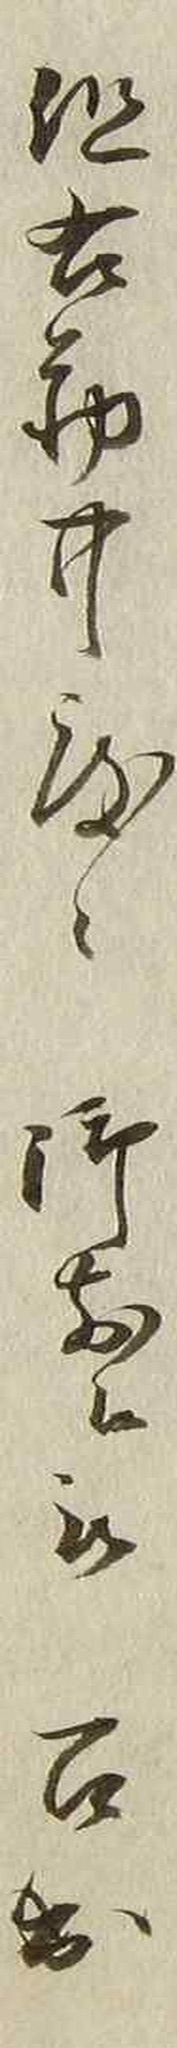但右勤中度々御前江被召出
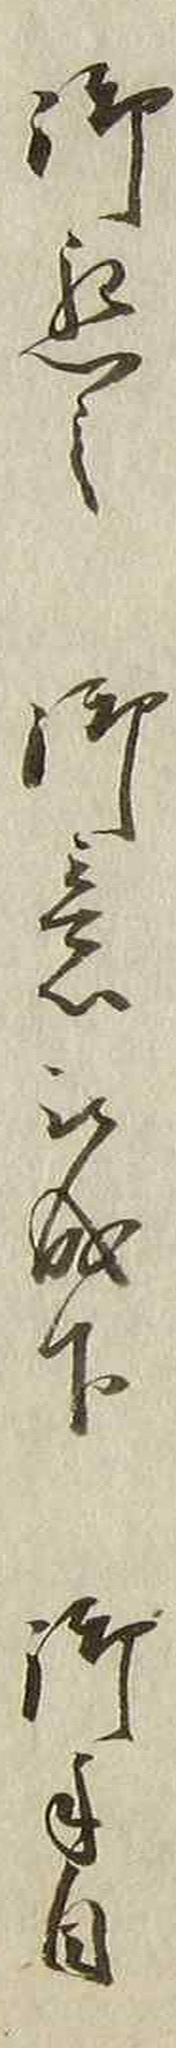御懇之御意被成下御手自
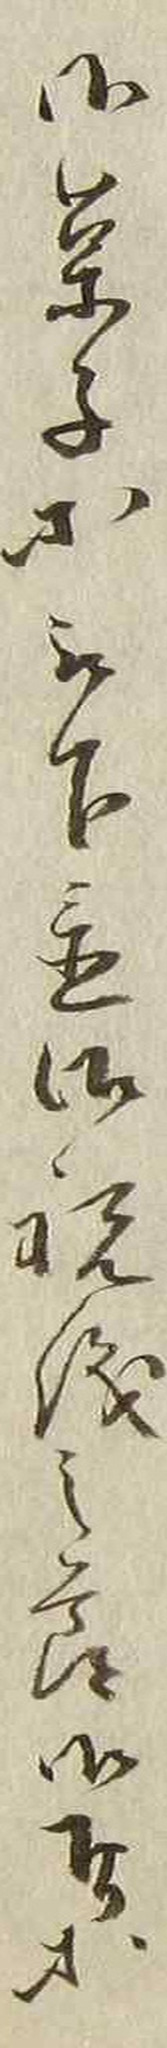御菓子等被下置御祝儀之節御下り等
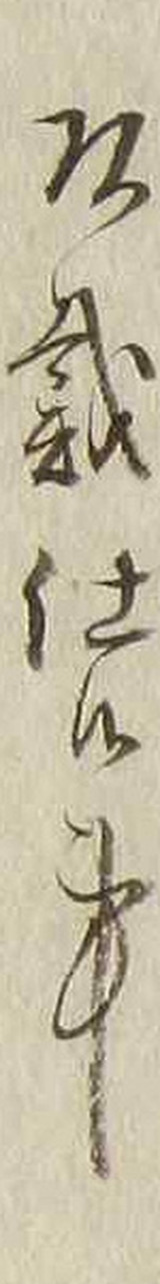頂戴仕候事

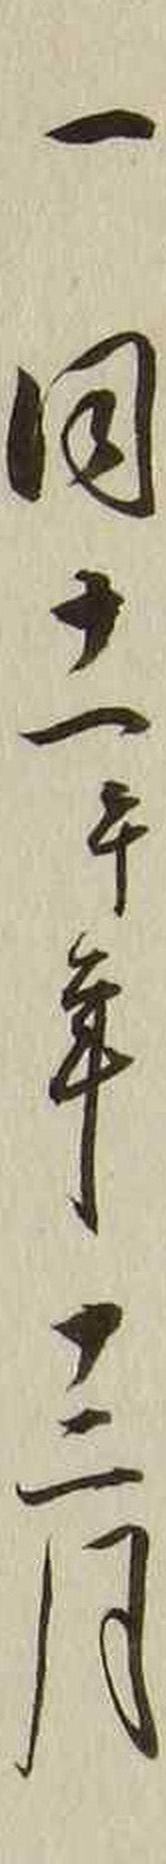一同十一午年十二月
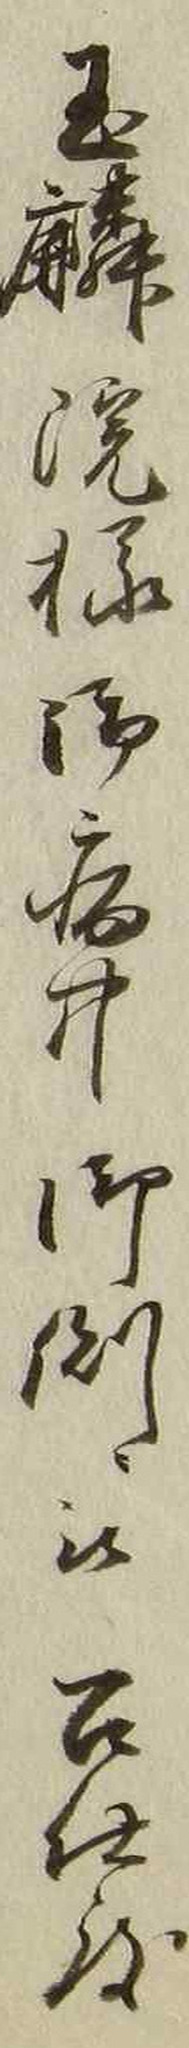玉麟院様御病中御側ニ被召仕度
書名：諸士系譜　巻之28　い之部28
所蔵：会津若松市立会津図書館
